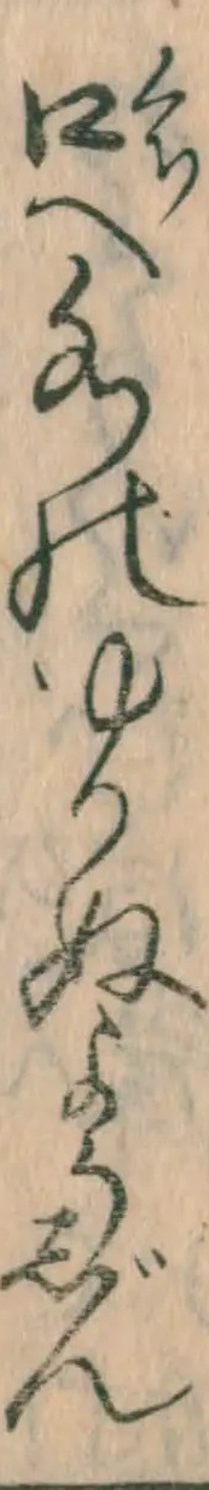口へ水のゆかぬようじん
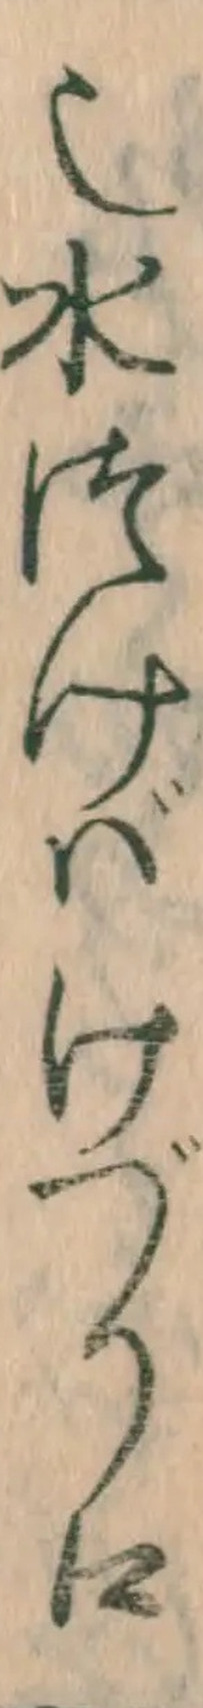也水つけばけづり口
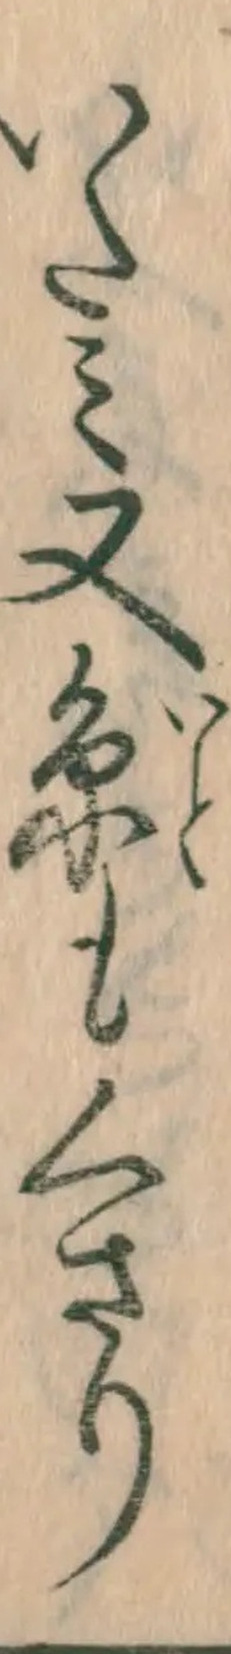いたみ又糸もくさり
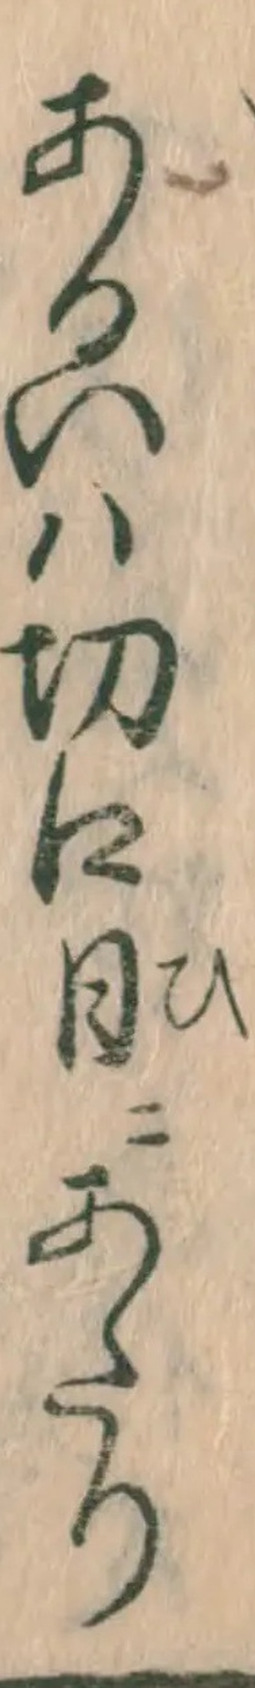あるいは切口日
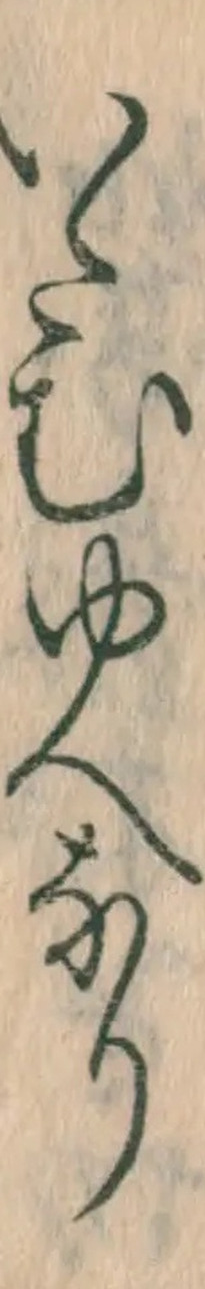いたむゆへなり
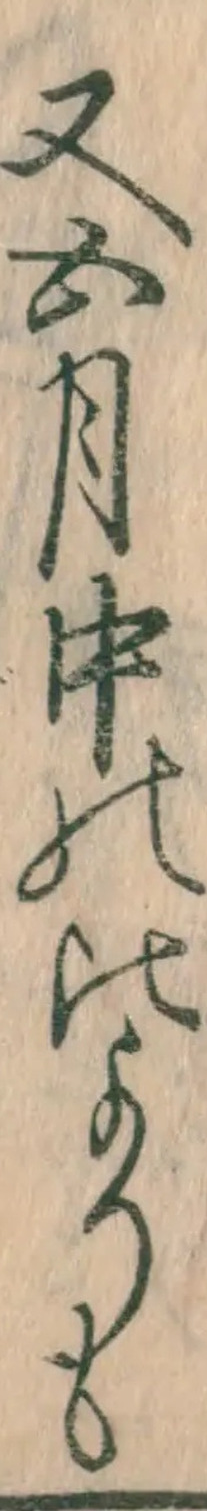又五月中の頃よりも
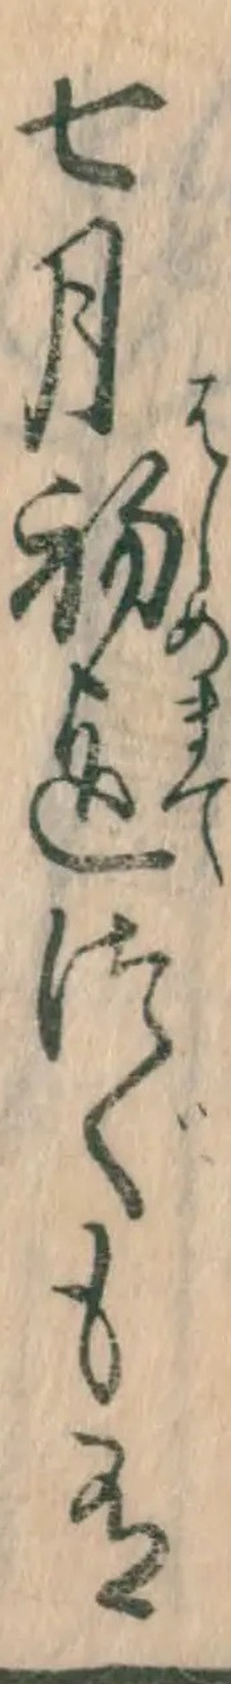七月初迄つぐも有
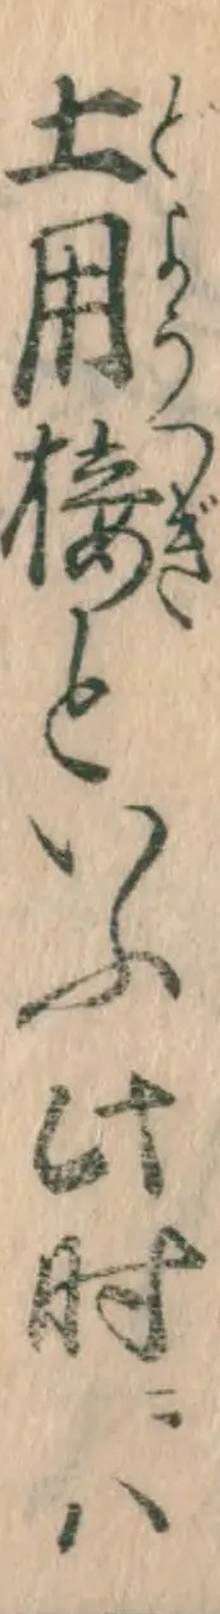土用接といふ此時
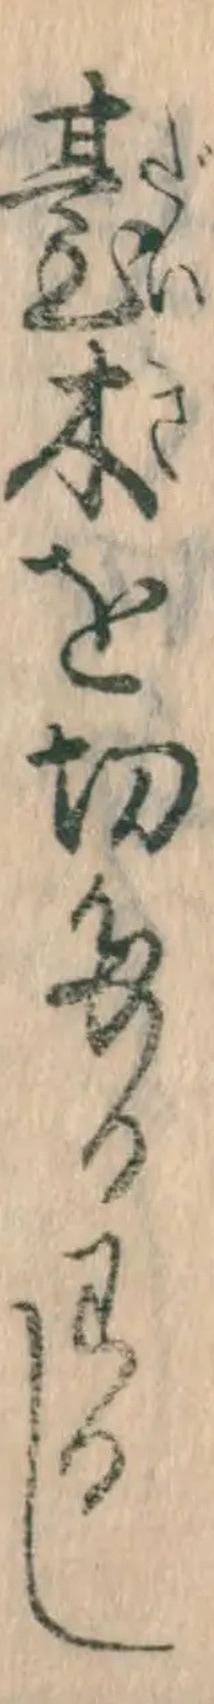䑓木を切たるわるし
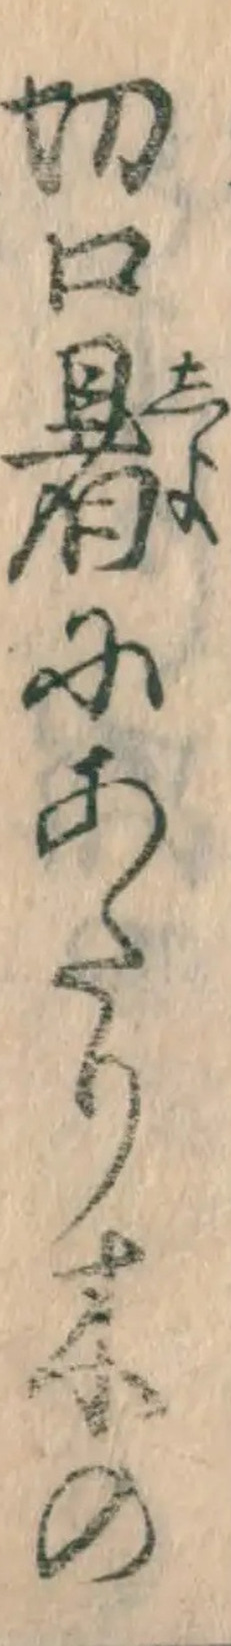切口暑にあたり木の
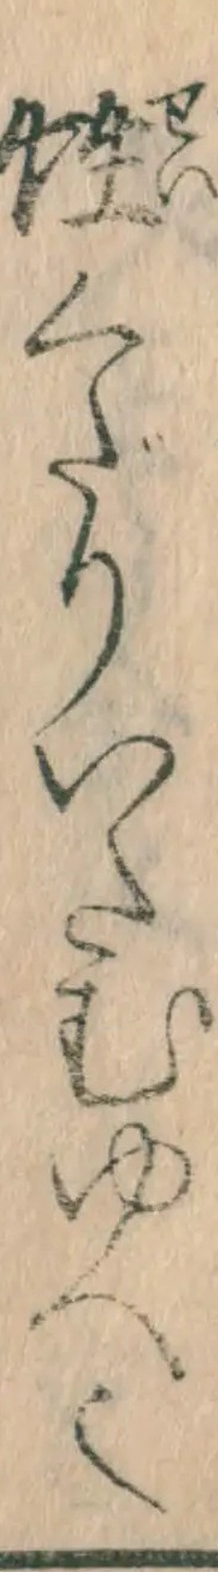性くだりいたむゆへ也

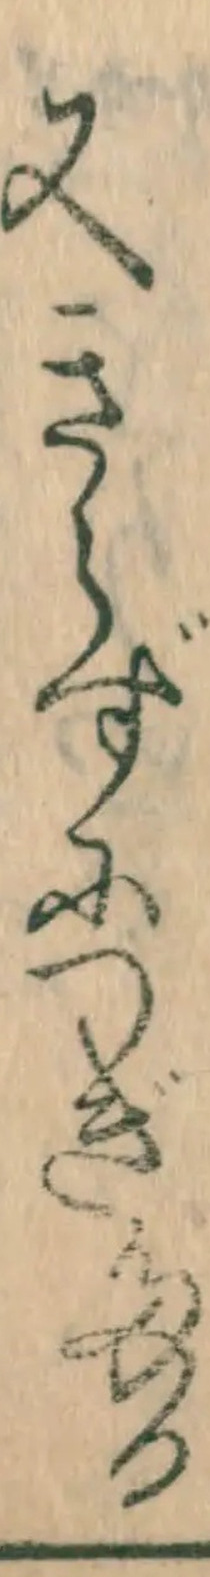又きらずにつぎたる
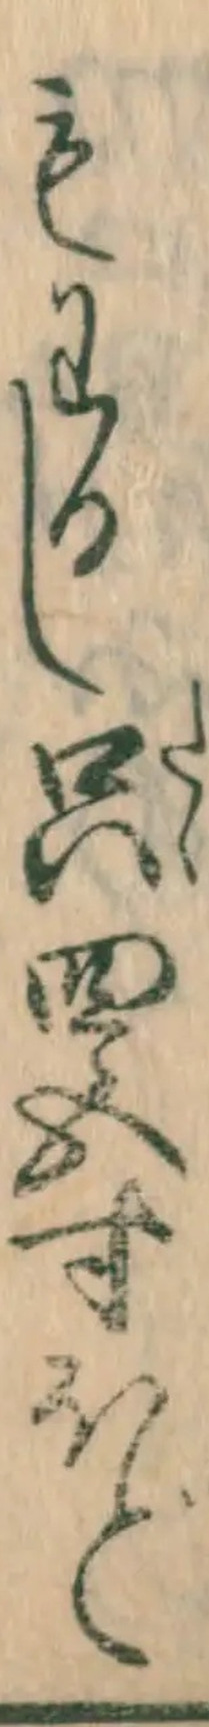もわるし只四五寸ほど
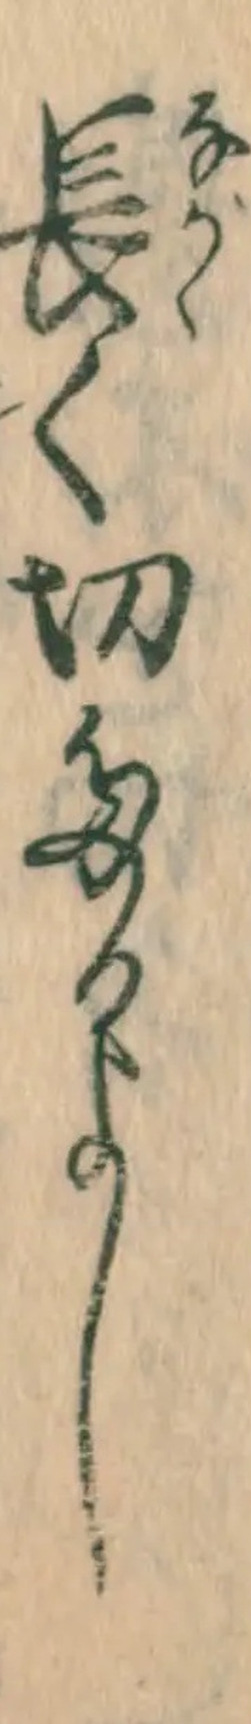長く切たるよし
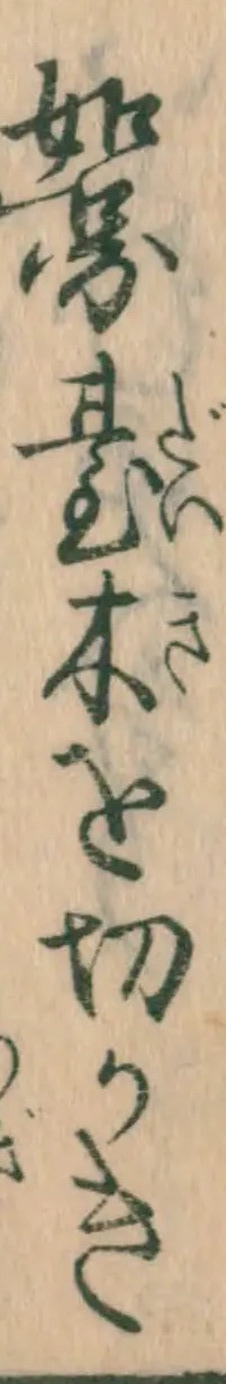如図䑓木を切かき
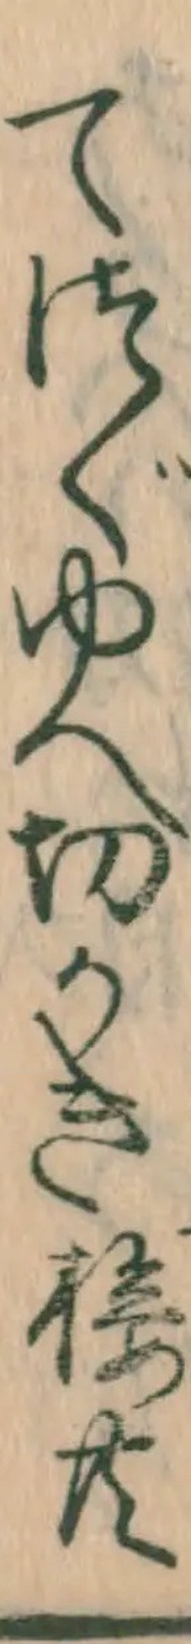てつぐゆへ切かき接共
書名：錦繍枕 5巻. [5]
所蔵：国立国会図書館 National Diet Library, JAPAN
